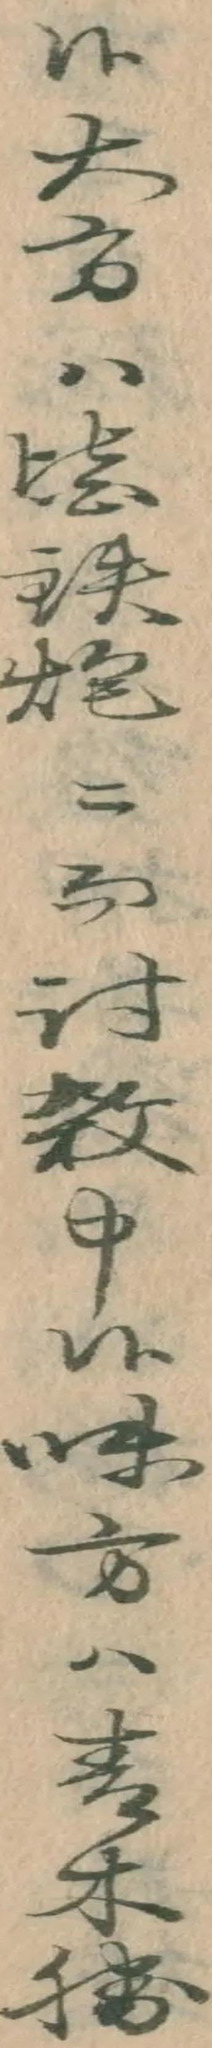候大方は皆鉄炮に而討殺申候味方は青木勝
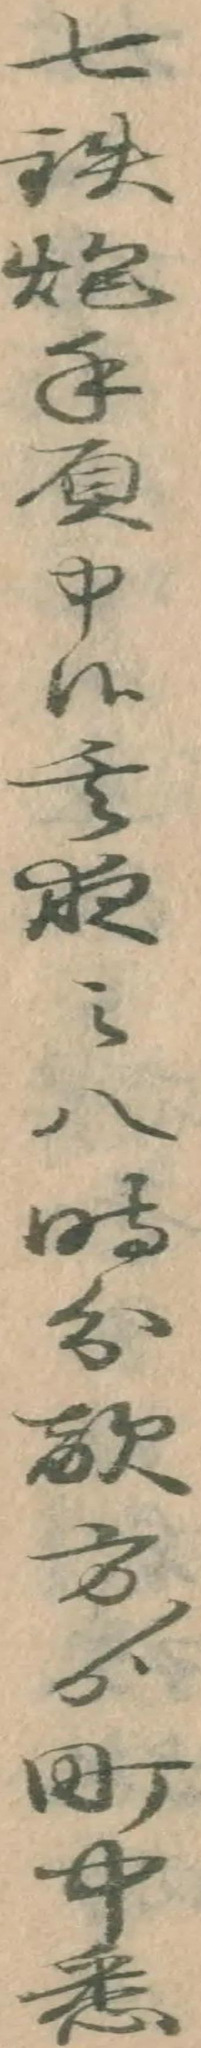七鉄炮手負申候其夜之八時分敵方ゟ町中悉
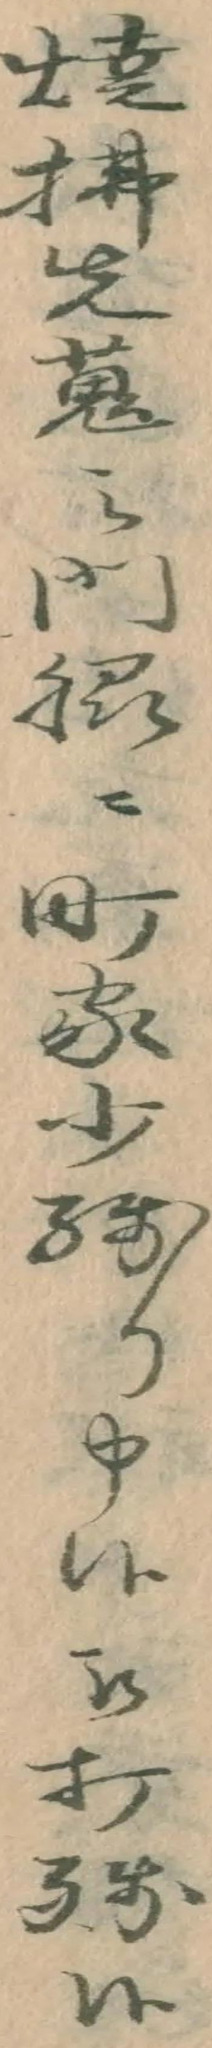焼払先蒐之門脇に町家少残り申候被打残候

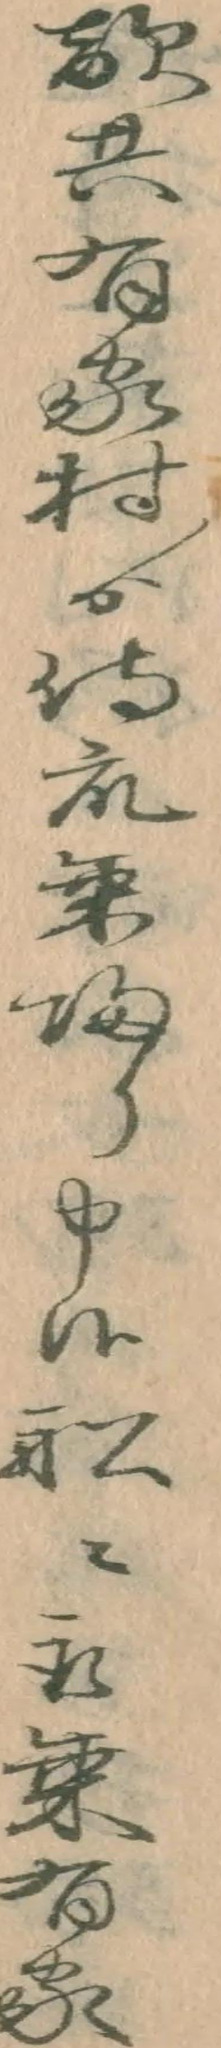敵共有家村ゟ侍衆乗帰り申候船に取乗有家
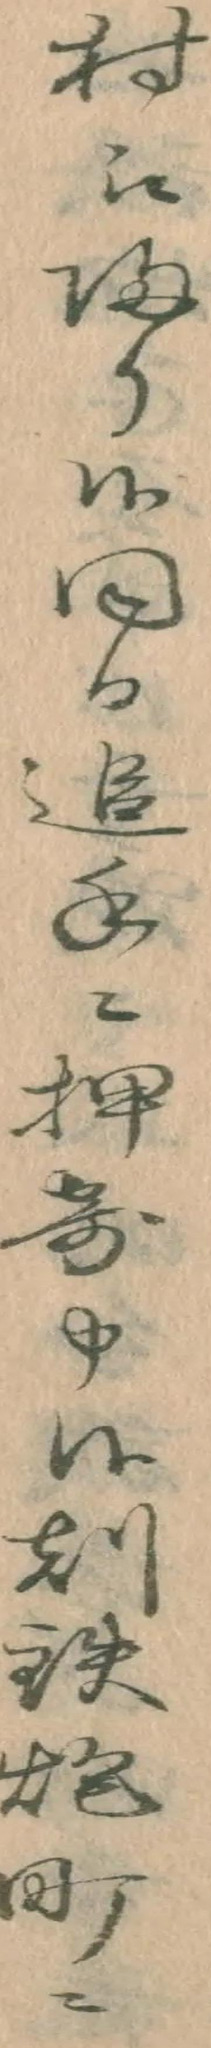村え帰り候同日追手に押寄申候刻鉄炮町に
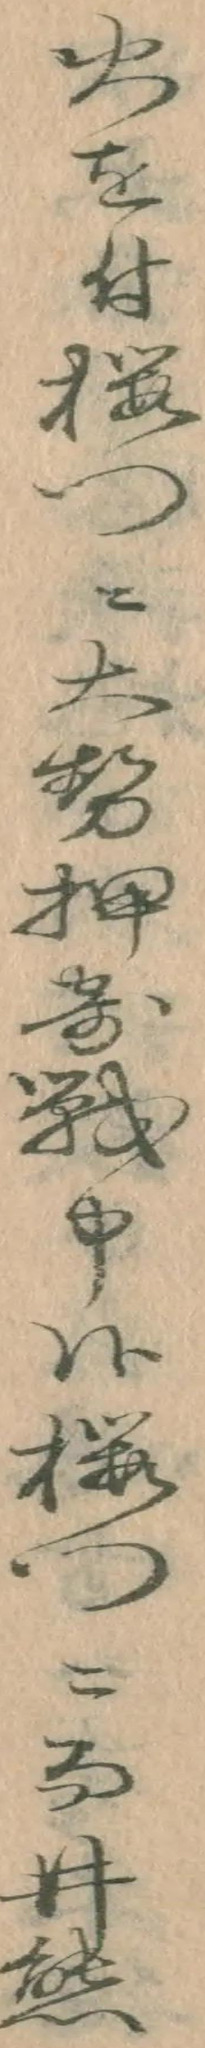火を付楼門に大勢押寄戦申候楼門に而井熊
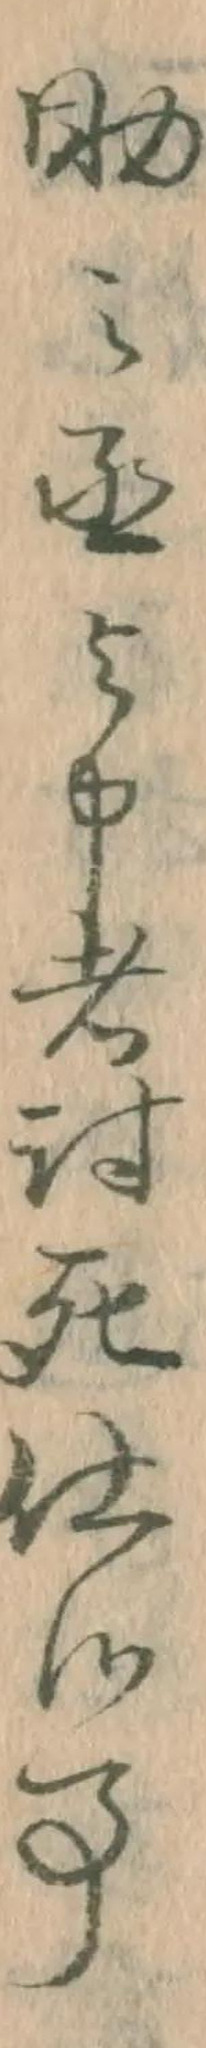助之丞与申者討死仕候事
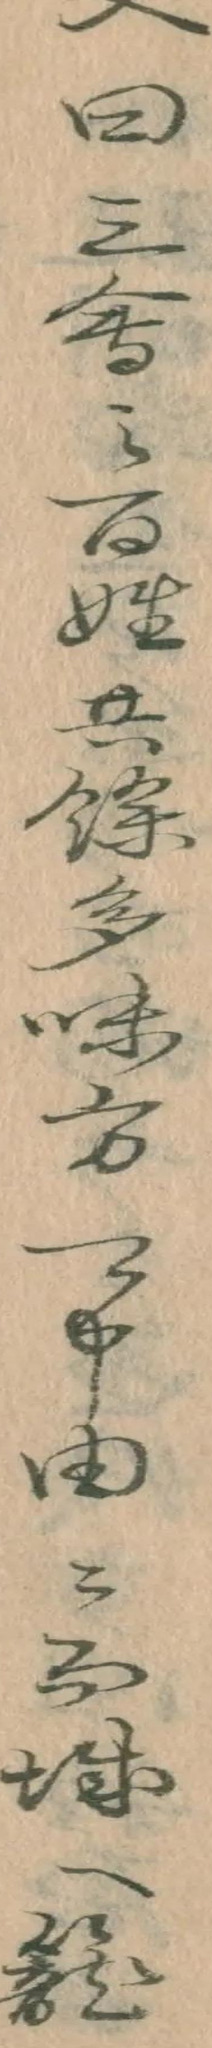又日三会之百姓共余多味方可申由に而城へ籠
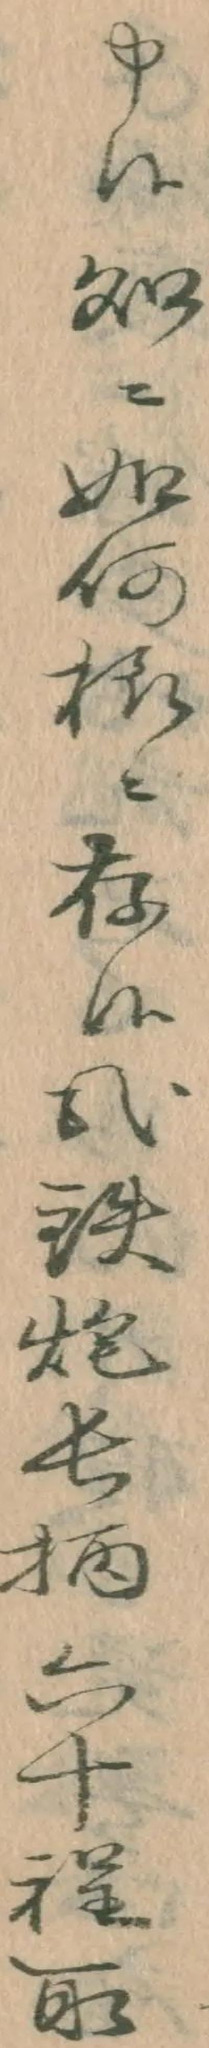申候処に如何様に存候哉鉄炮長柄六十程取
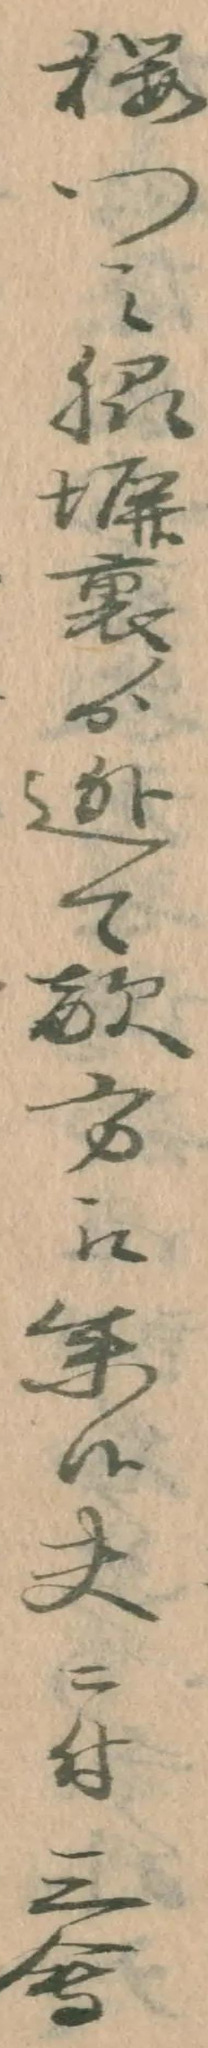楼門之脇塀裏ゟ逃て敵方え参候夫に付三会
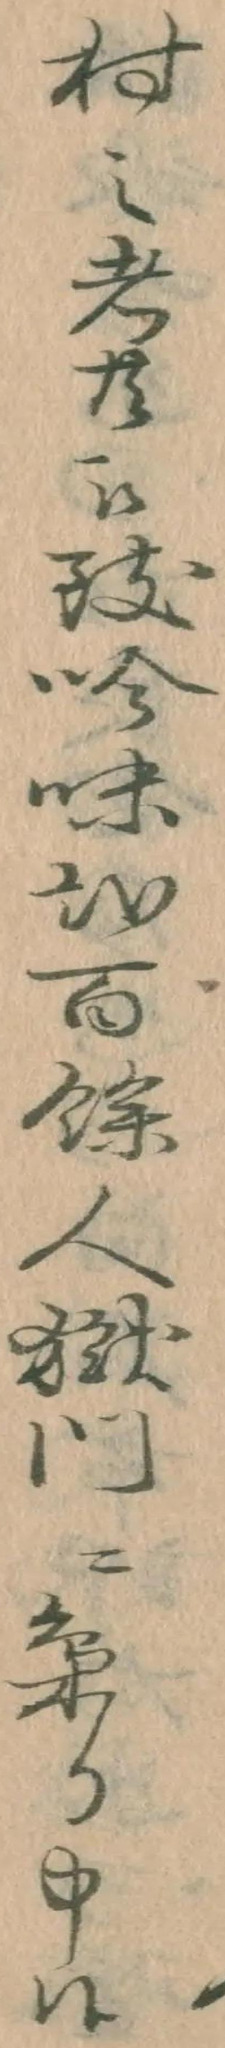村之者共被致吟味弐百余人獄門に集り申候
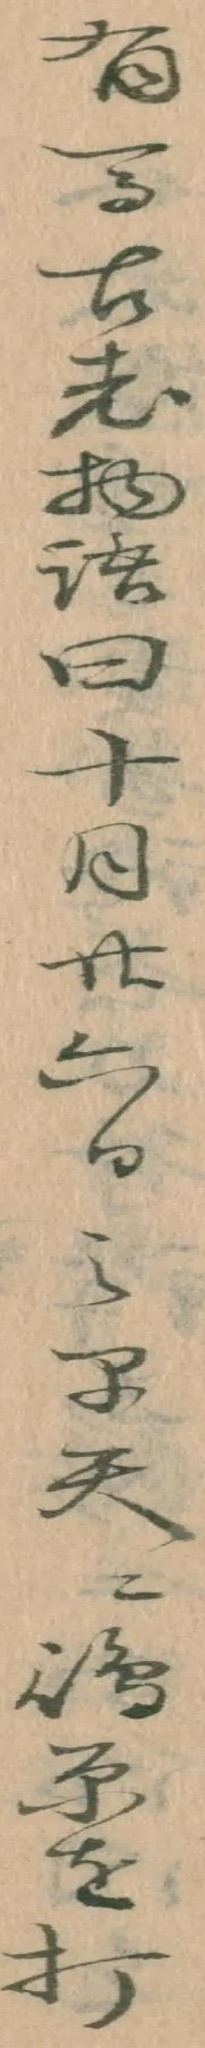有馬古老物語日十月廿六日之早天に島原を打
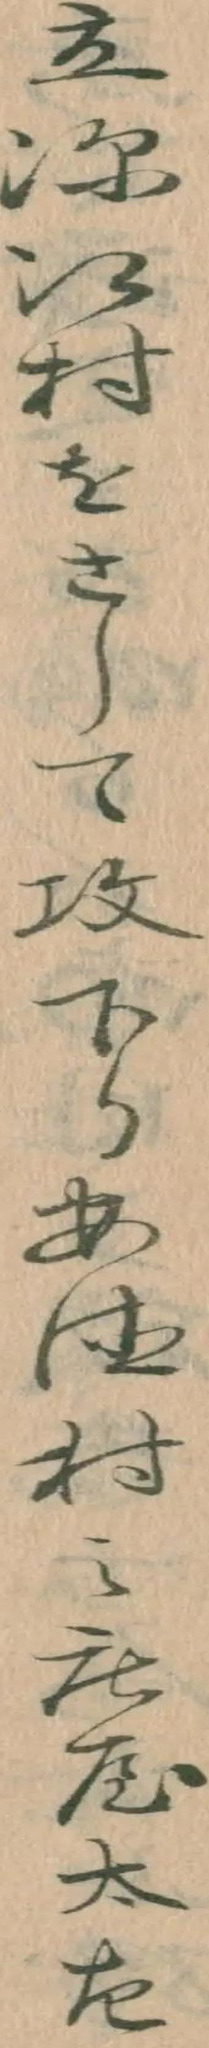立深江村をさして攻下り安徳村之庄屋太左
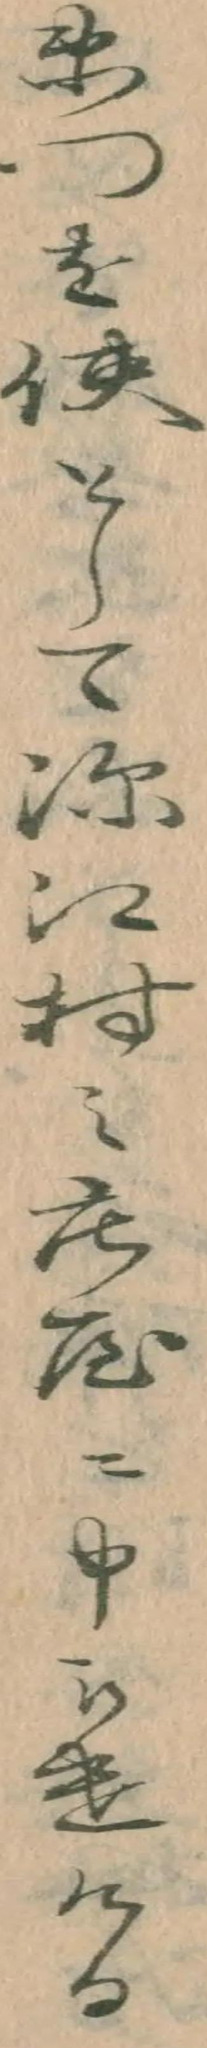衛門を使として深江村之庄屋に申被遣ける
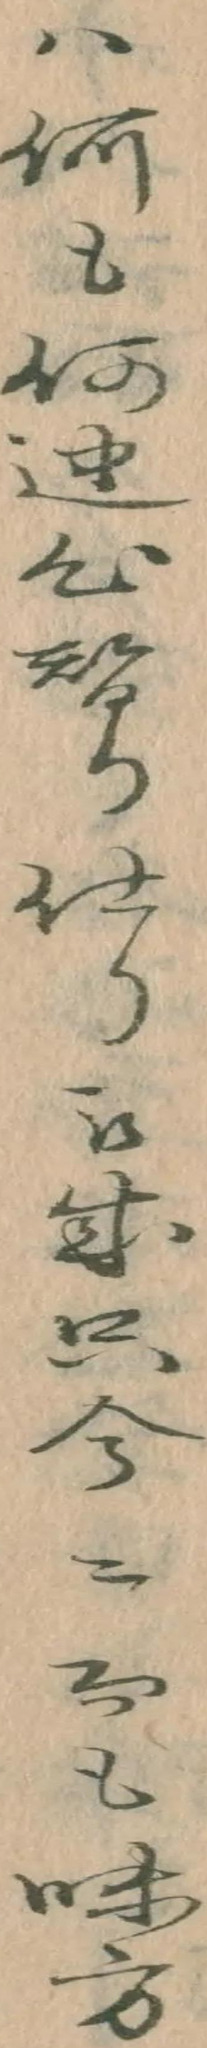は何も何迚心変替り仕り被成只今に而も味方
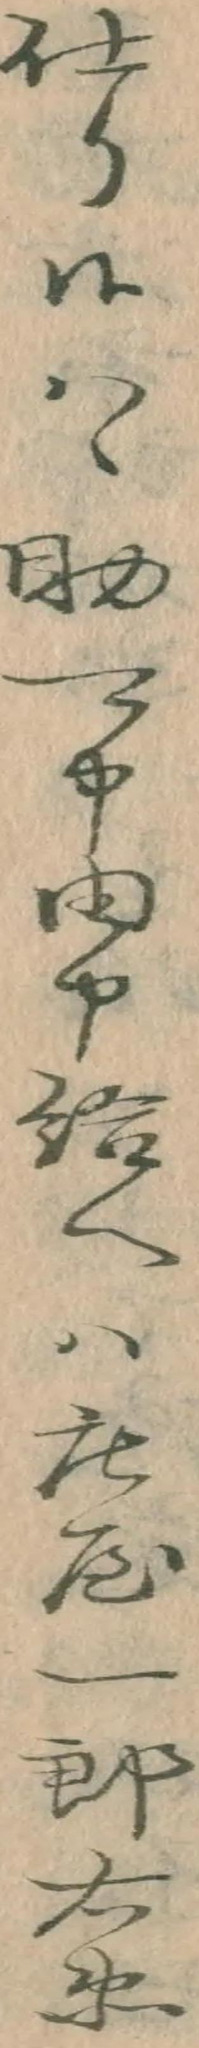仕り候はゝ助可申由申給へは庄屋一郎右衛
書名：切支丹御退治記 49巻. [1]
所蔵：国立国会図書館 National Diet Library, JAPAN
